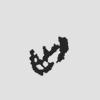出
